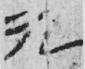九
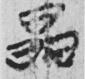晶
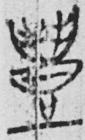豐
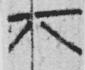亓（其）
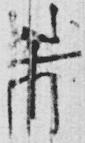芾（沛）
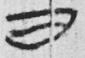日
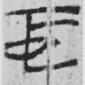𠁩
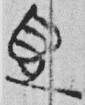見
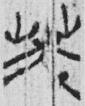○（瞞）
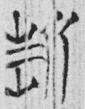折
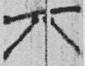亓（其）
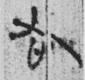右
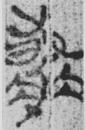○（肱）
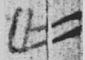亡
